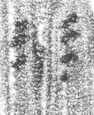不
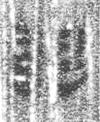智（知）
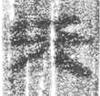亓（其）
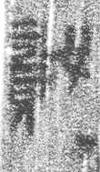敗（敗）
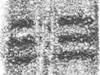三
